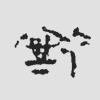{金攴}
